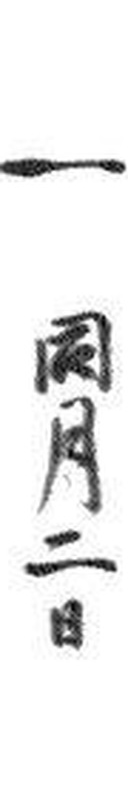一同月二日
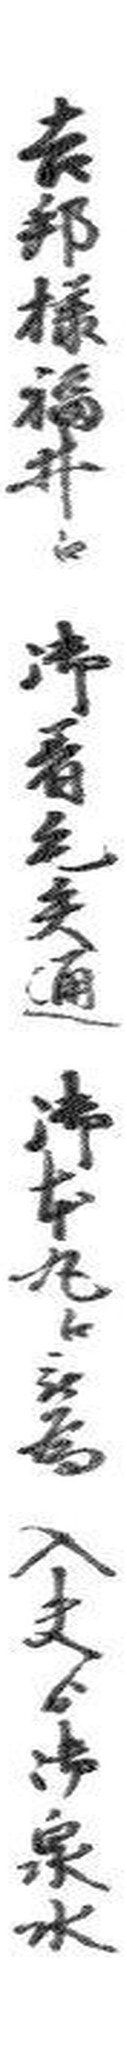吉邦様福井江御着毛矢通御本丸江被為入夫ゟ御泉水
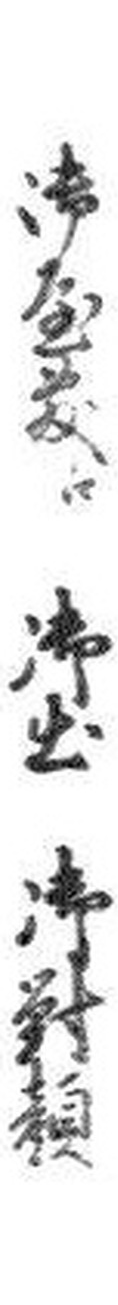御屋敷江御出御対顔
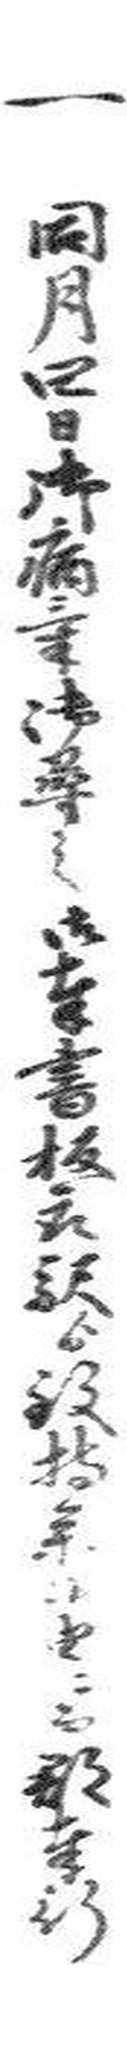一同月四日御病気御尋之御奉書板取駅ゟ致持参候由ニ而郡奉行
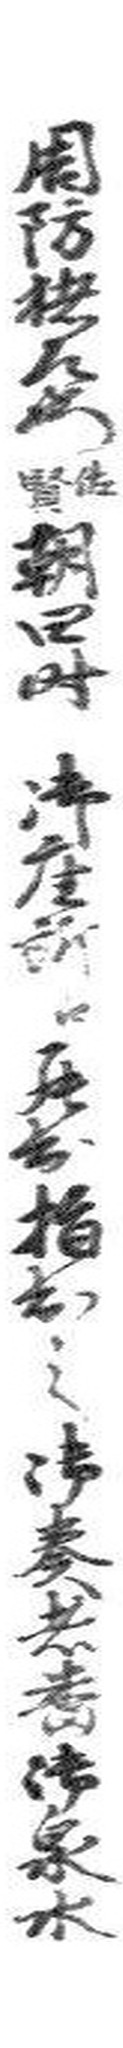周防猪左衛門佐賢朝四時御座所江罷出指出之御奏者番御泉水
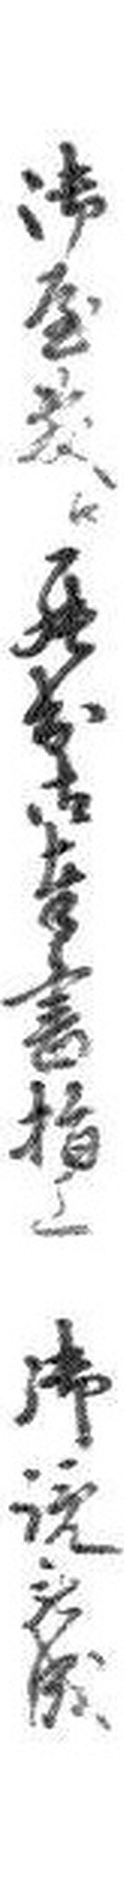御屋敷江罷出御奉書指上御覧被成
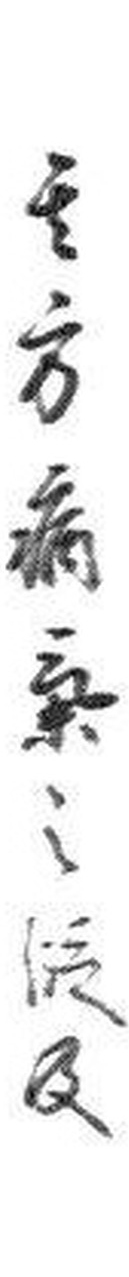其方病気之段及
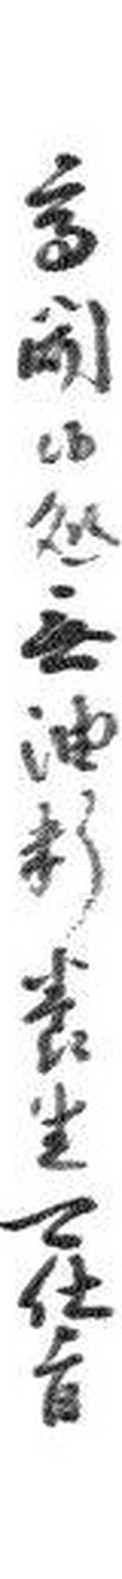高聞候処無油断養生可仕旨
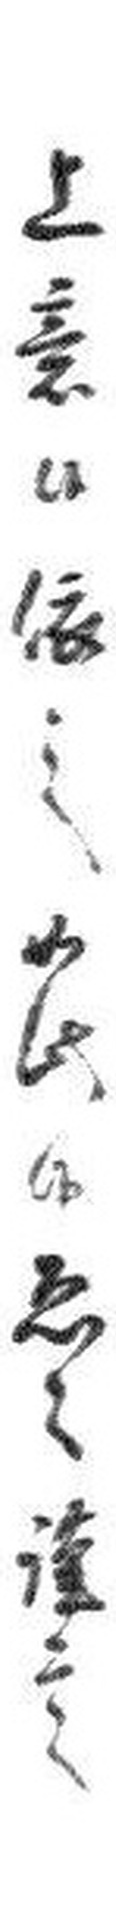上意候依之如此候恐々謹言

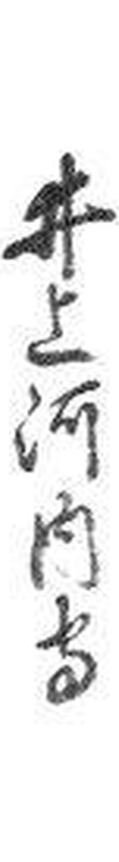井上河内守
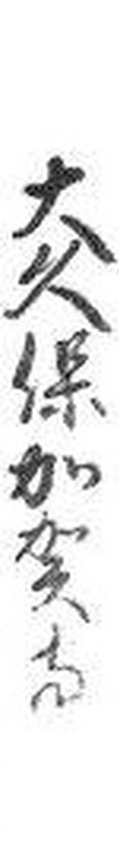大久保加賀守
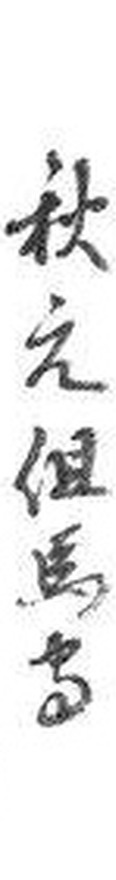秋元但馬守
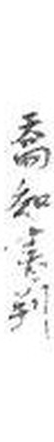喬知書判
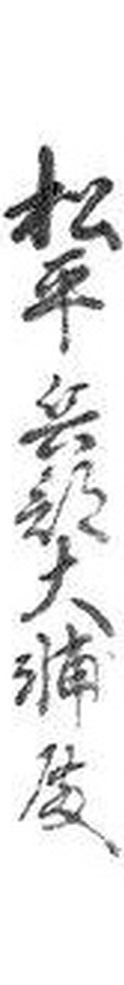松平兵部大輔殿
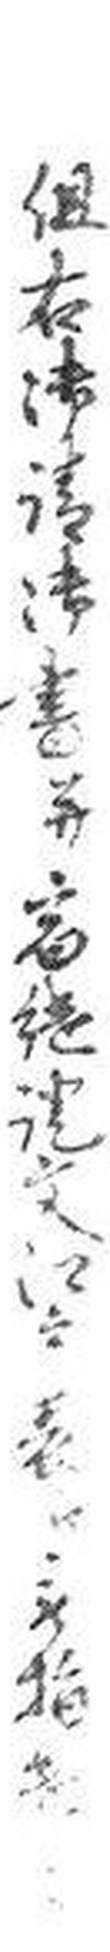但右御請御書幷宿継証文江戸表江被指遣之
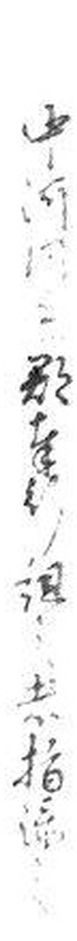中河内郡奉行組之者指添之
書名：家譜 二十六 吉品公 従宝永七年到正徳二年
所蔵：福井県文書館 Fukui Prefectural Archives
